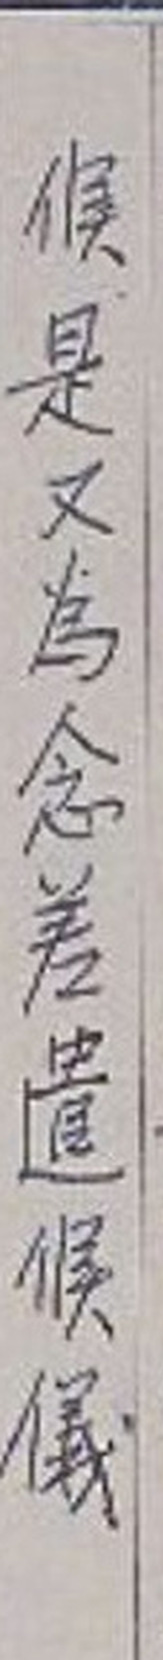候是又為念差遣候儀
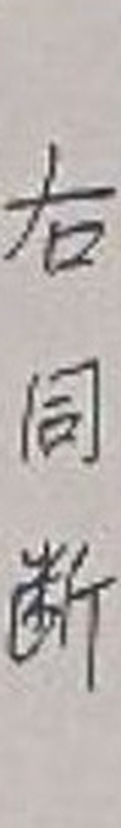右同断
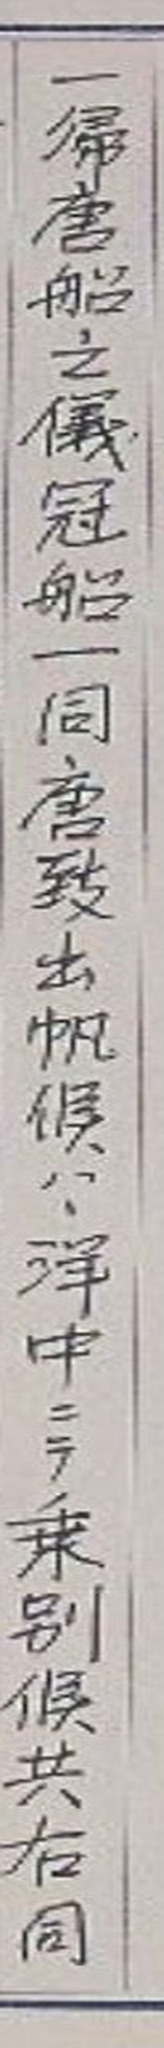一帰唐船之儀冠船一同唐致出帆候はゝ洋中にての乗別候共右同
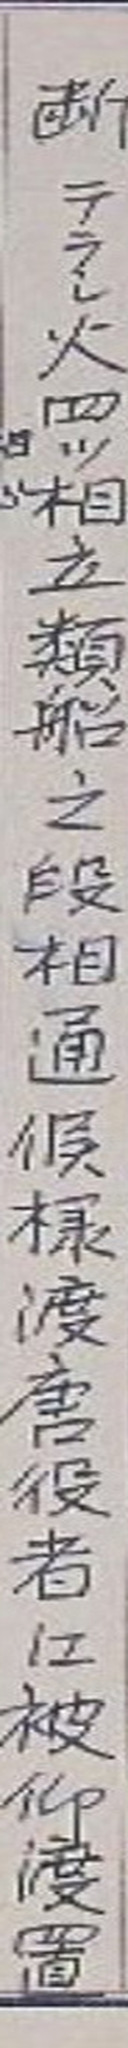断てらし火四つ相立類船之段相通候様渡唐役者え被仰渡置
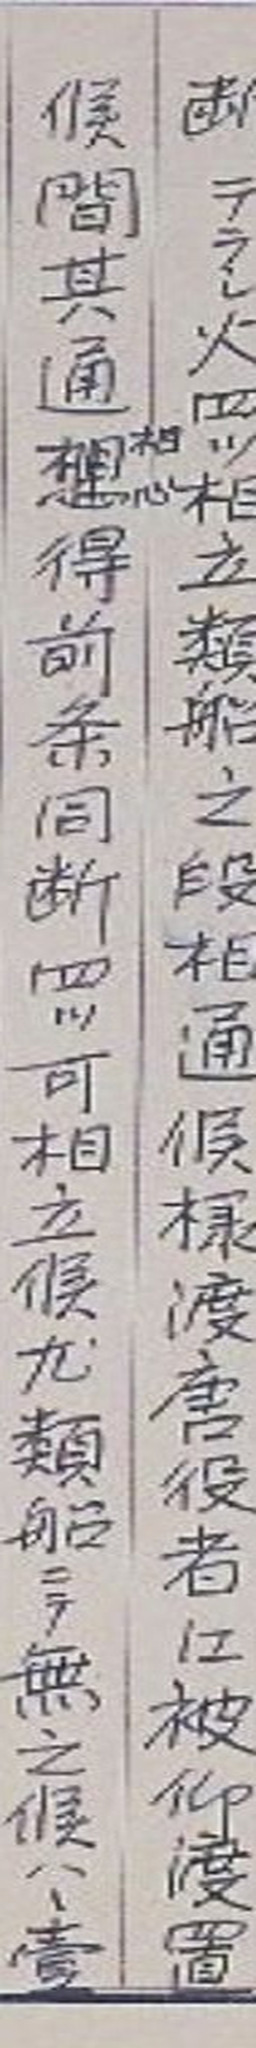候間其通相心得前条同断四つ可相立候尤類船にて無之候はゝ壱
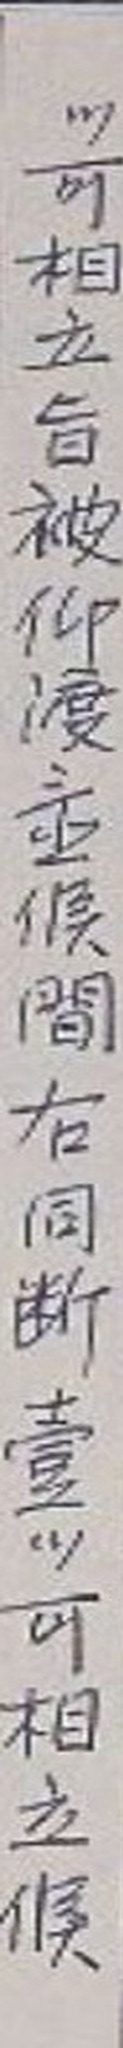つ可相立旨被仰渡置候間右同断壱つ可相立候
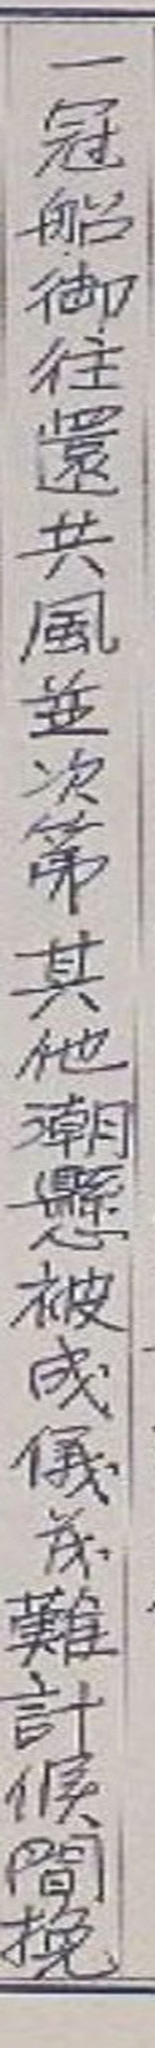一冠船御往還共風並次第其他潮懸被成儀も難計候間挽
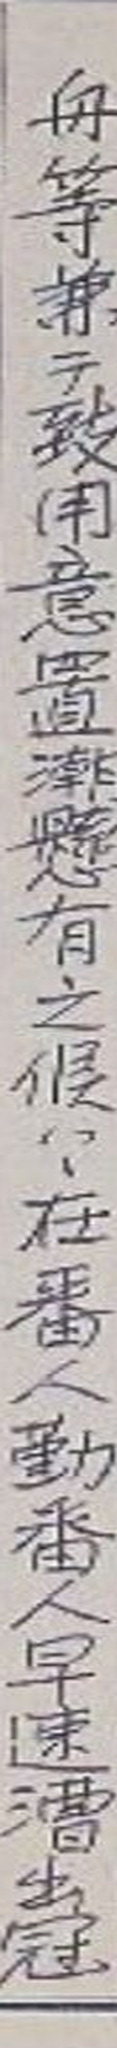舟等兼て致用意置潮懸有之候はゝ在番人勤番人早速漕出冠
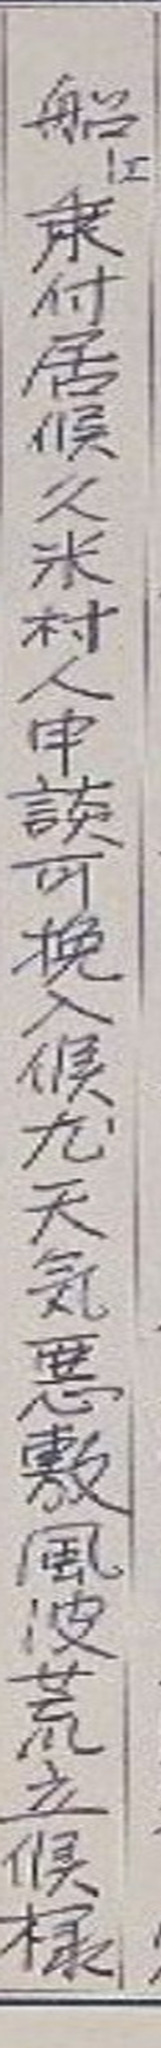船え乗付居候久米村人申談可挽入候尤天気悪敷風波荒立候様
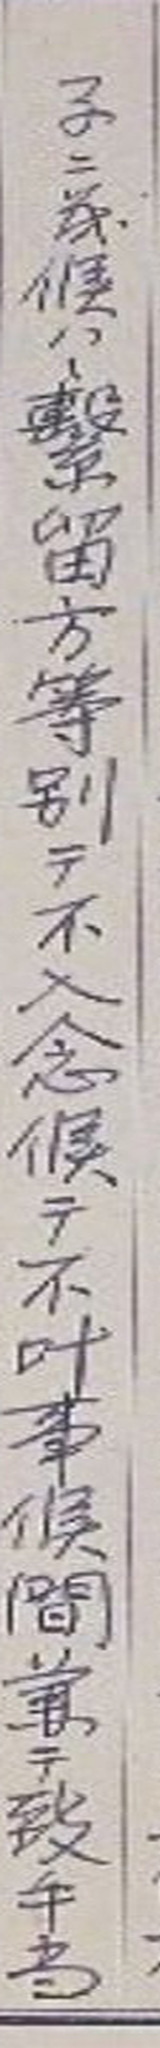子にも候はゝ繋留方等別て不入念候て不叶事候間兼て致手当
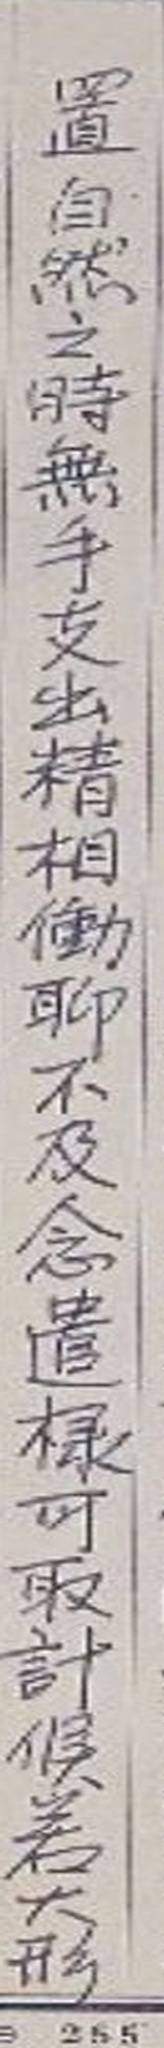置自然之時無手支出精相働聊不及念遣様可取計候若大形
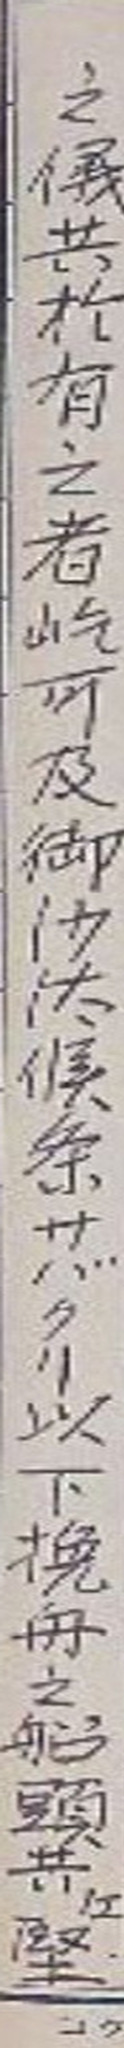之儀共於有之者屹可及御沙汰候条さばくり以下挽舟之船頭共え堅
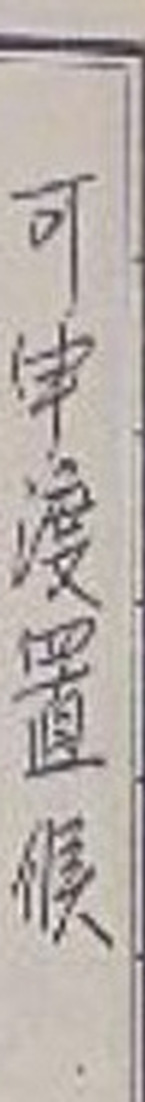可申渡置候
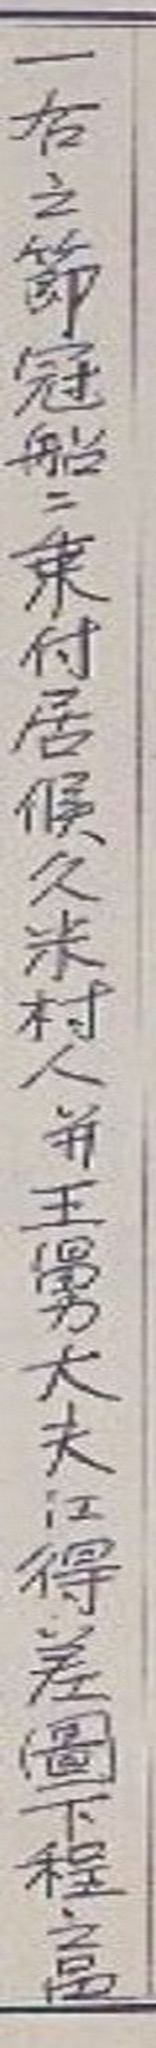一右之節冠船に乗付居候久米村人并王舅大夫え得差図下程之品
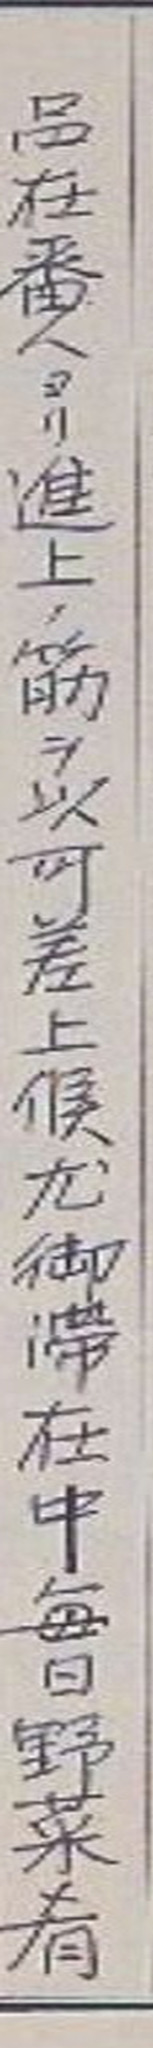品在番人より進上の筋を以可差上候尤御滞在中毎日野菜肴
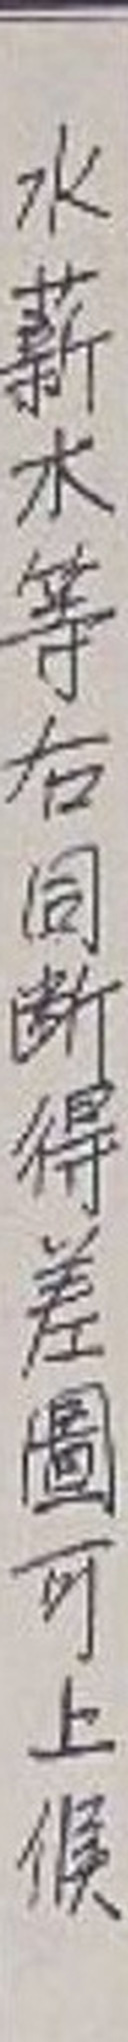水薪木等右同断得差図可上候
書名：支那冊封使来琉諸記 下巻
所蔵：University of the Ryukyus Library
